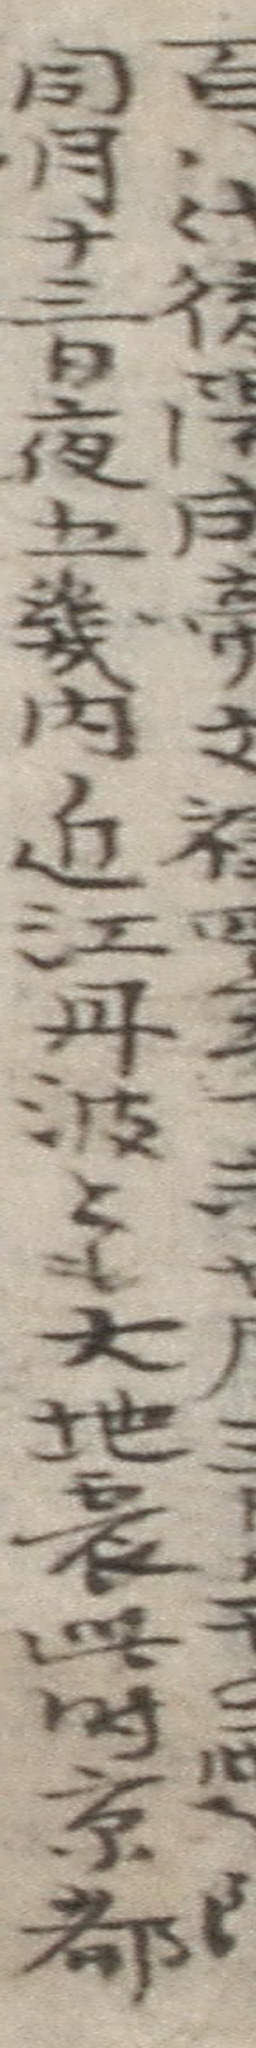同月十三日夜五幾近江丹波とも大地震此時京都
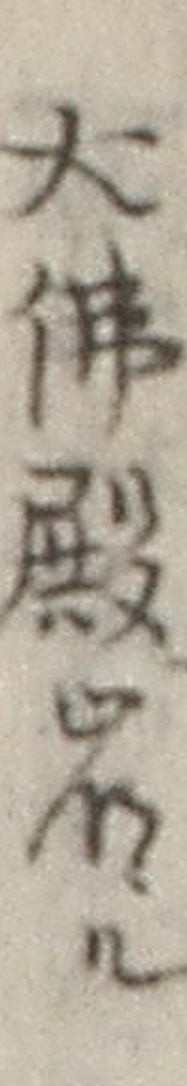大仏殿崩る
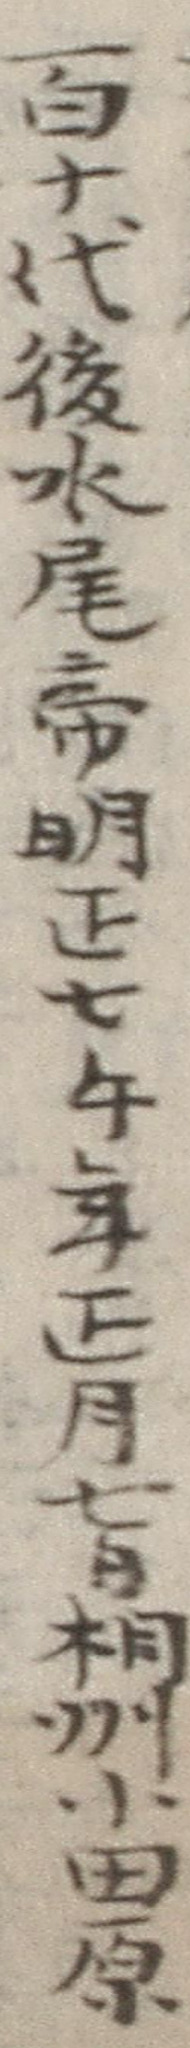百十第後水尾帝明正七午年正月七日相州小田原
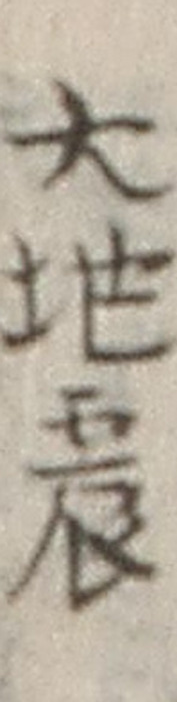大地震
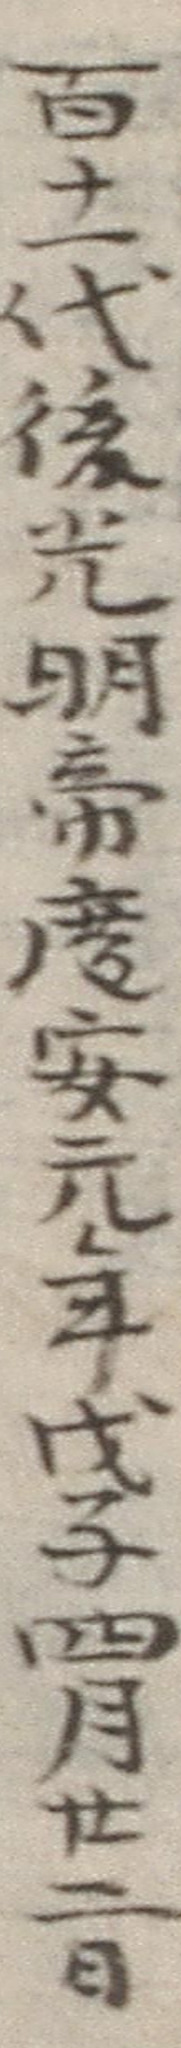百十一代後光明帝慶安元年戊子四月廿二日
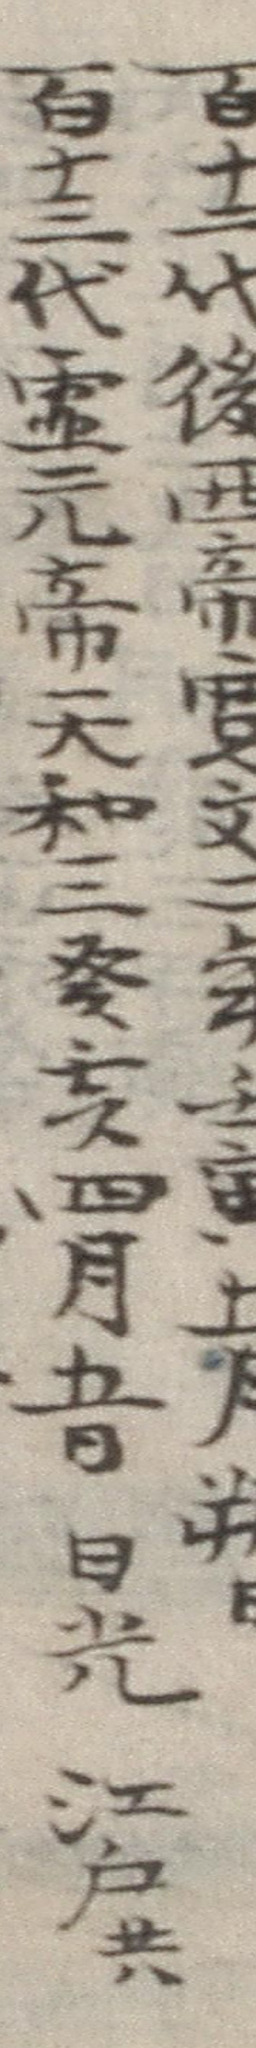百十二代霊元帝天和三癸亥四月五日日光江戸共
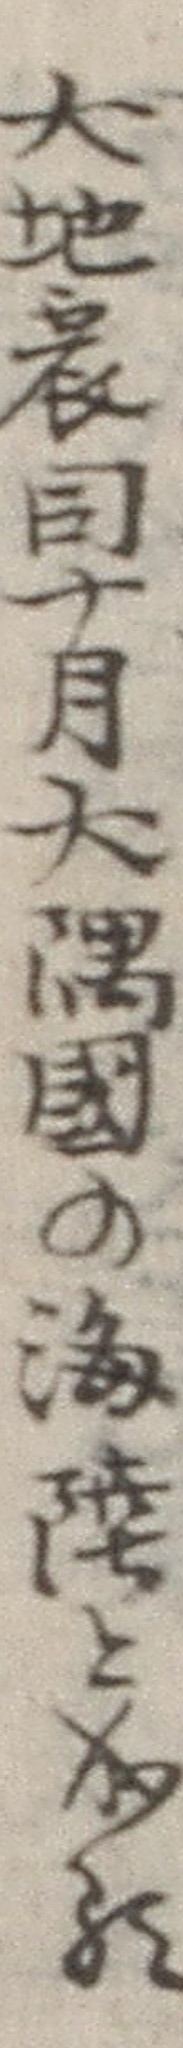大地震同十月大隅國の海陸と成る
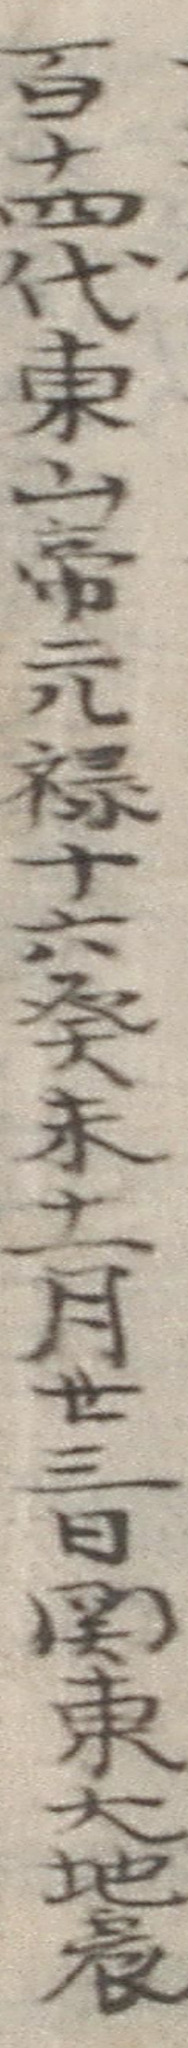百十四代東山帝元禄十六癸未十一月二十三日関東大地震
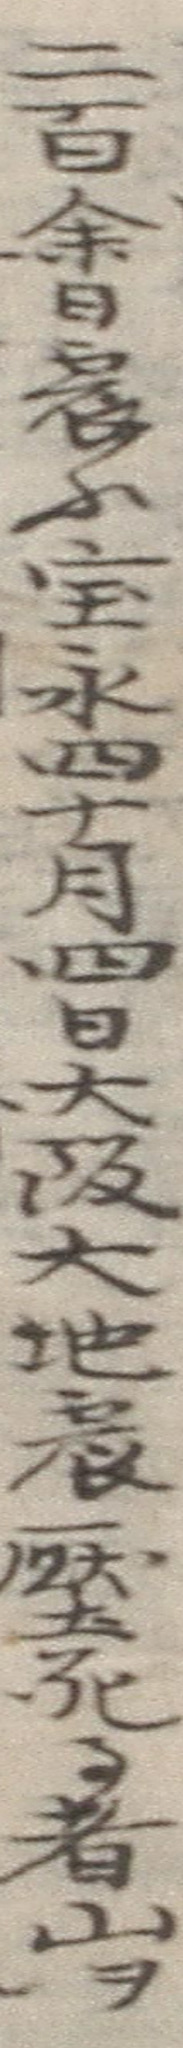二百余日震ふ宝永四十月四日大阪大地震壓死る者山を
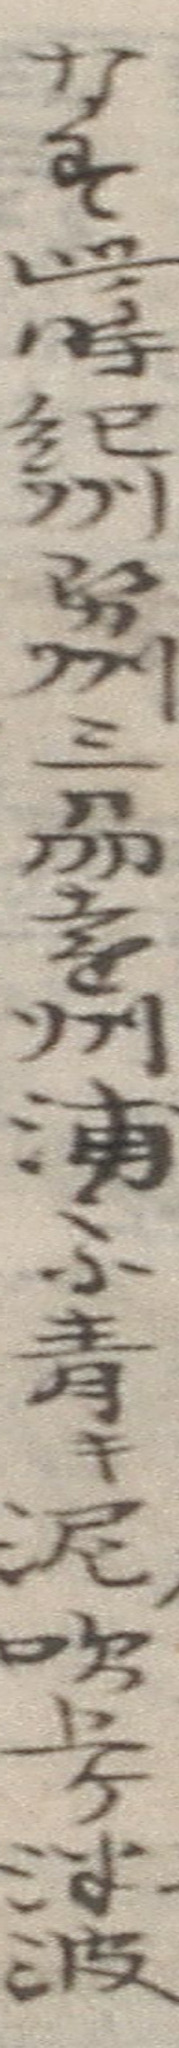なす此時紀州勢州三州遠州浦々に青き泥吹上け津波
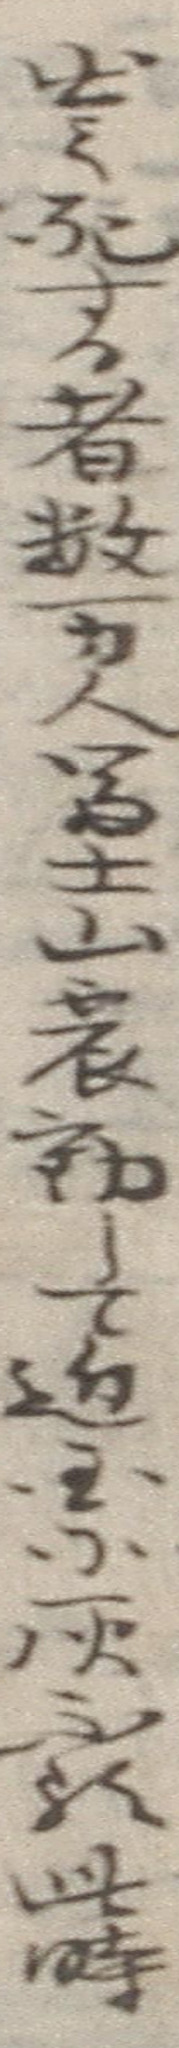出て死する者数万人富士山震動して近国に灰ふる此時
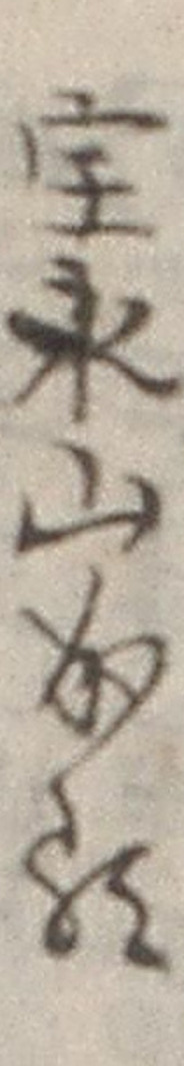宝永山成る
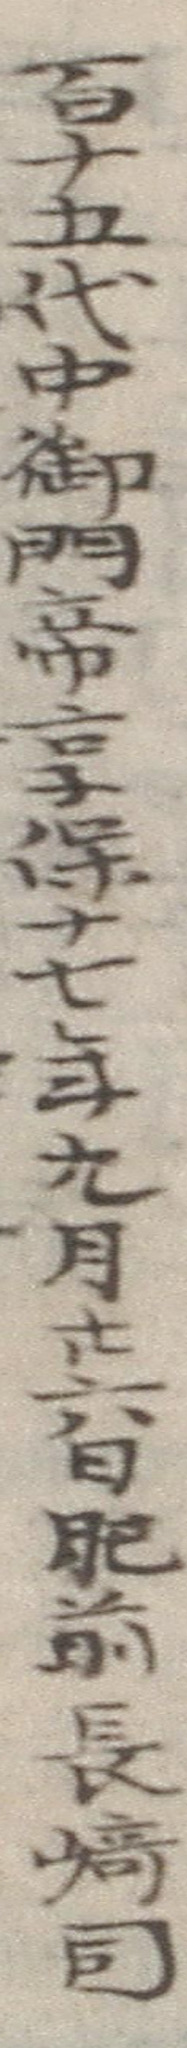百十五代中御門帝享保十七年九月廿六日肥前長崎同
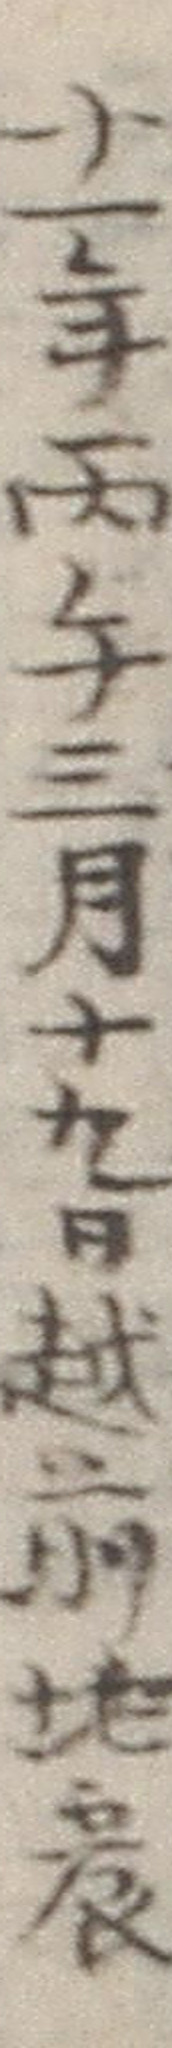十一年丙午三月十九日越前地震
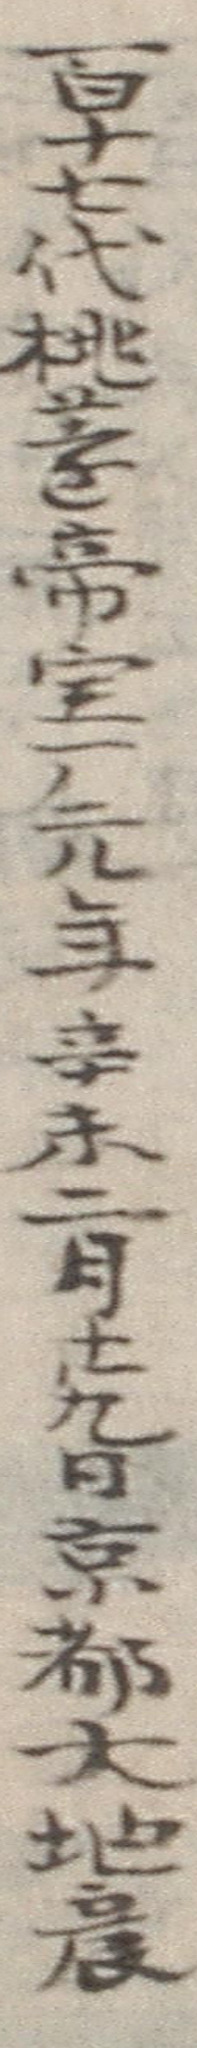百十七代桃園帝宝暦元年辛未二月廿九日京都大地震
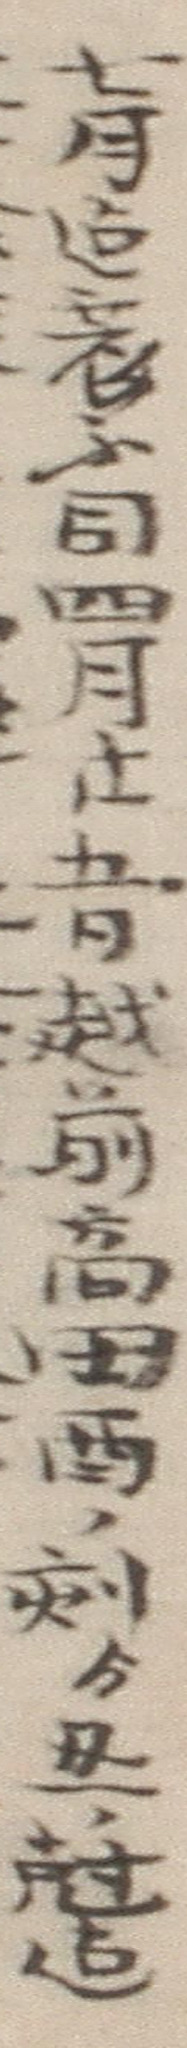七月迄震ふ同四月廿五日越前高田酉の刻より丑の尅迄
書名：諸國大地震年代記末代噺種
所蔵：東京大学地震研究所図書室 Earthquake Research Institute Library, The University of Tokyo, JAPAN
